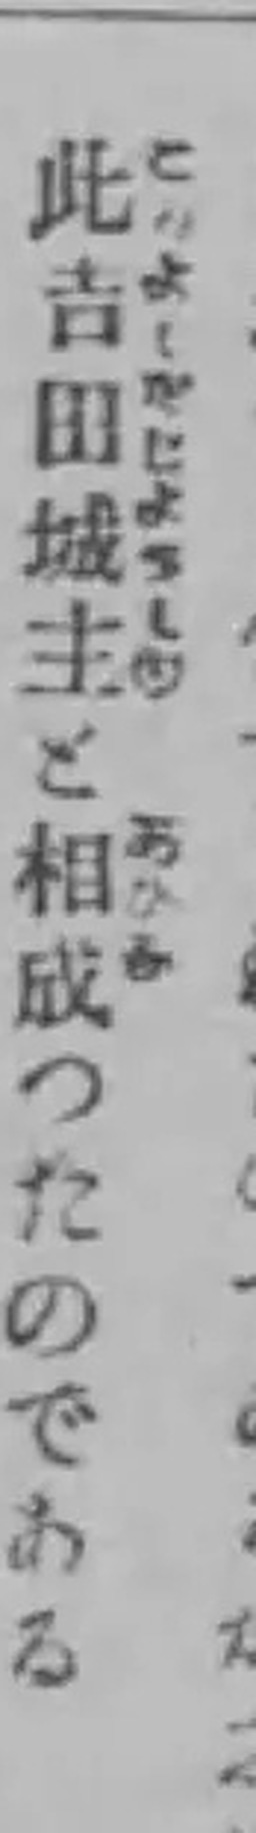此吉田城主と相成つたのである
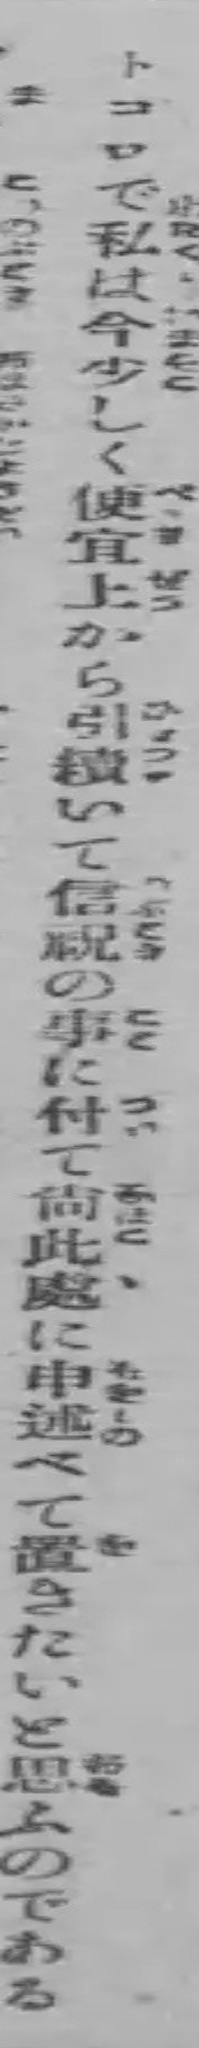トコロで私は今少しく便宜上から引続いて信祝の事に付て尚此処に申述べて置きたいと思ふのである
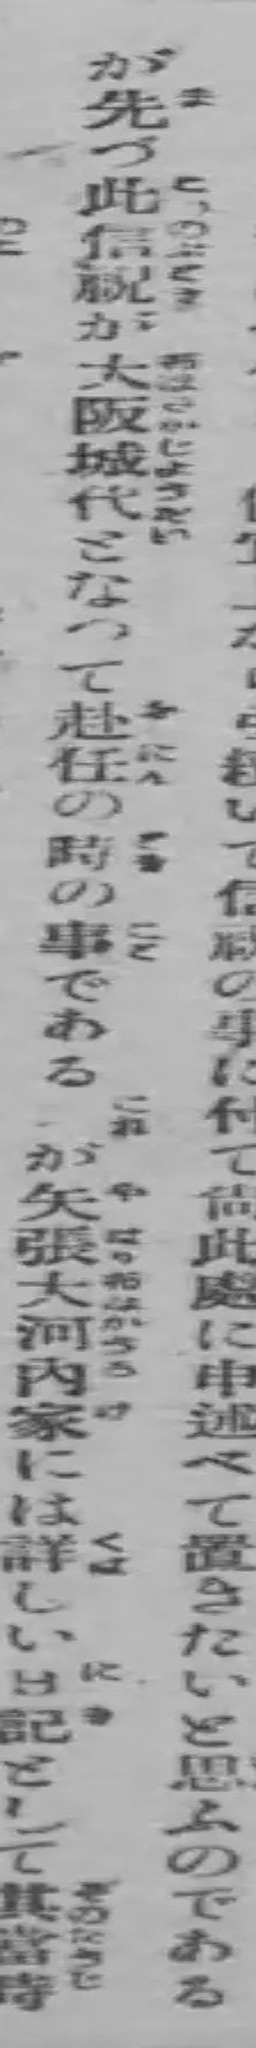が先づ此信祝が大阪城代となつて赴任の時の事である之が矢張大河内家には詳しい日記として其当時
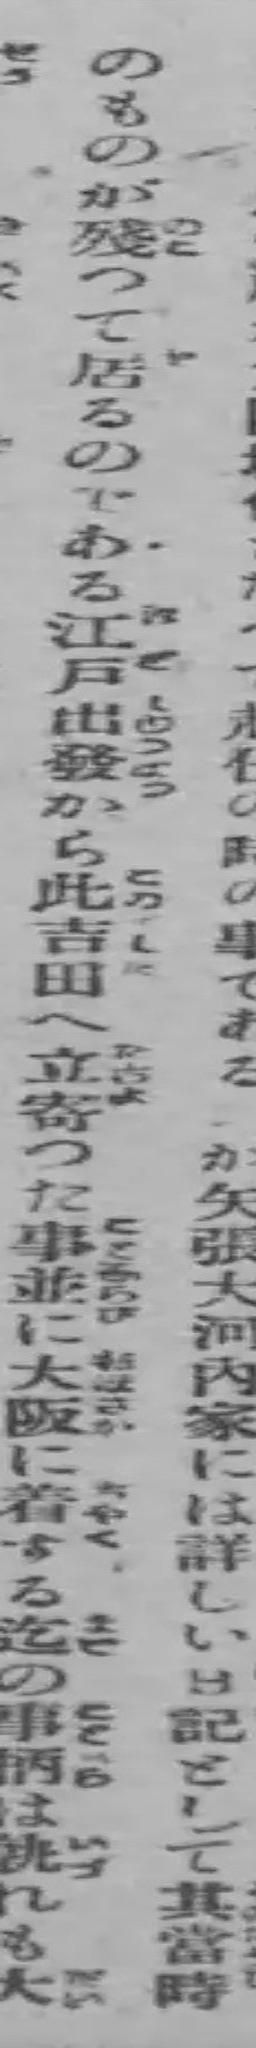のものが残つて居るのである江戸出発から此吉田へ立寄つた事並に大阪に着する迄の事柄は孰れも大
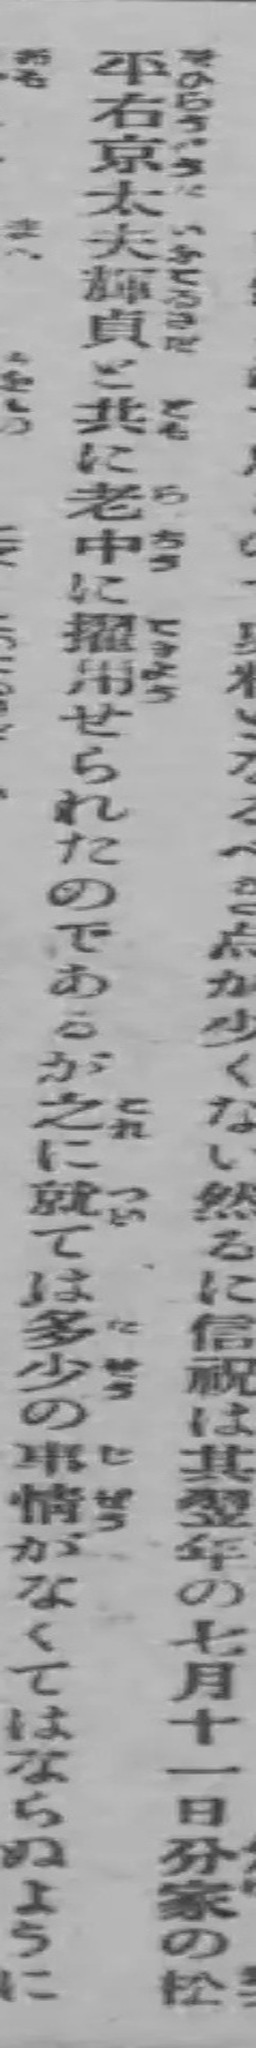平右京太夫輝貞と共に老中に擁用せられたのであるが之に就ては多少の事情がなくてはならぬように
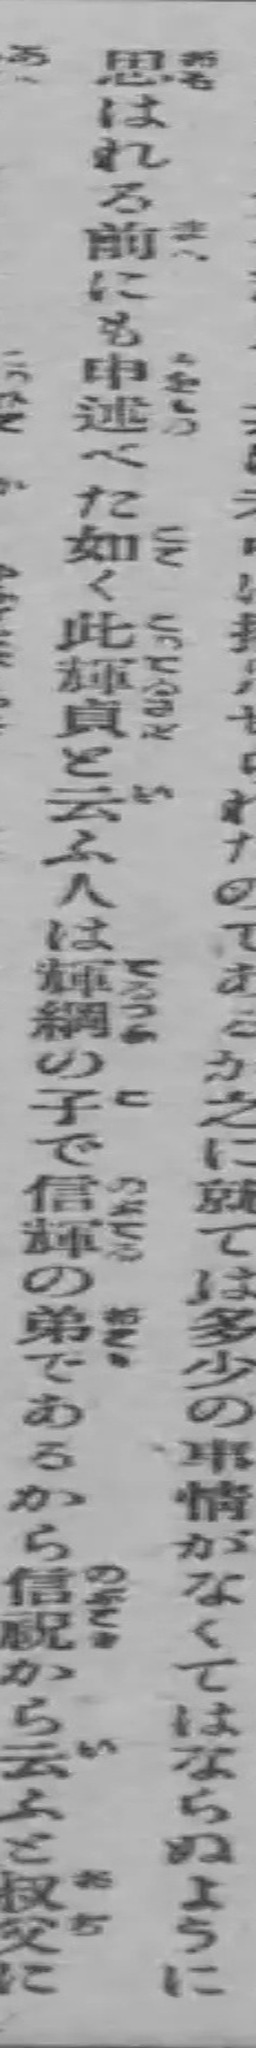思はれる前に申述べた如く此輝貞と云ふ人は輝綱の子で信輝の弟であるから信祝から云ふと叔父に
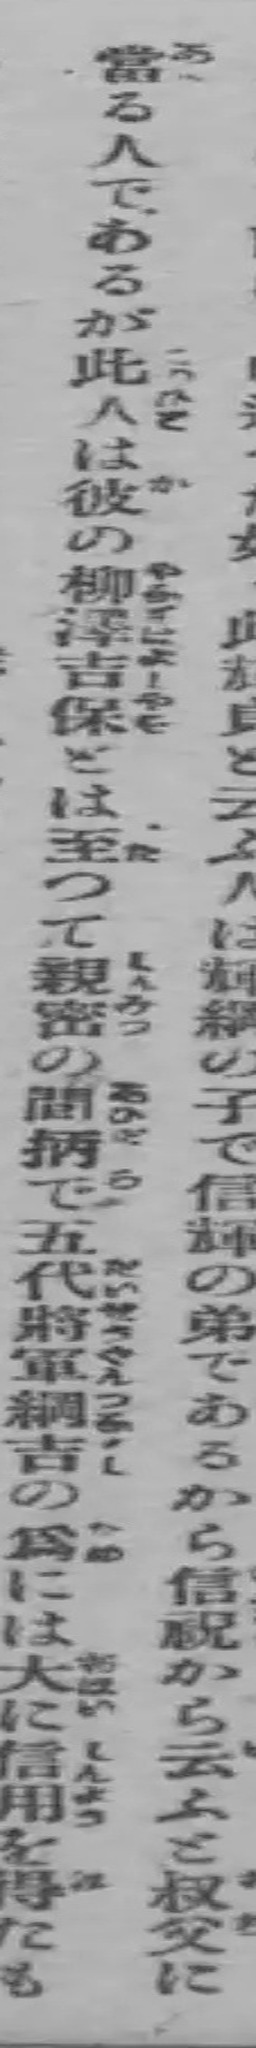当る人であるが此人は彼の柳沢吉保とは至つて親密の間柄で五代将軍綱吉の為には大に信用を得たも
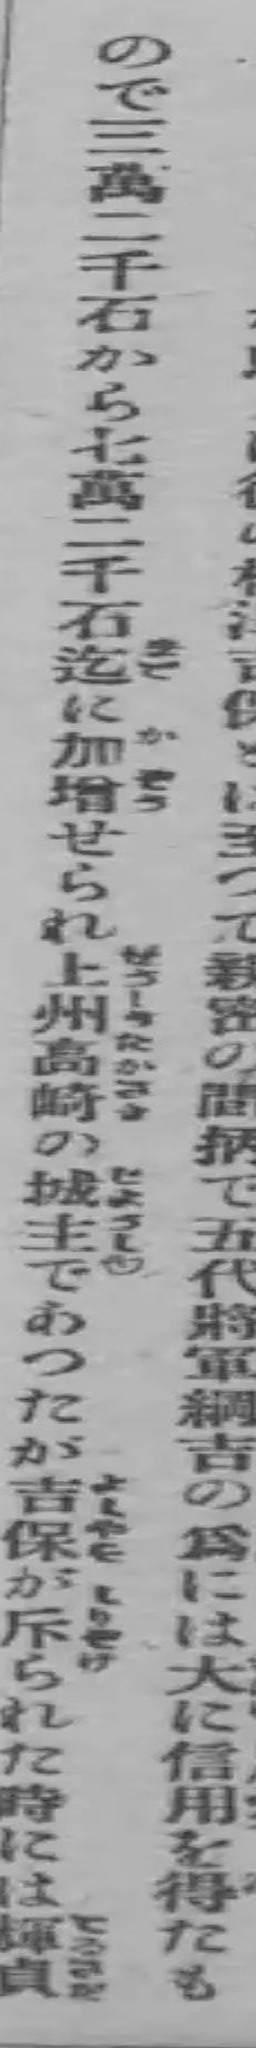ので三万二千石から七万二千石迄に加増せられ上州高崎の城主であつたが吉保が斥られた時には輝貞
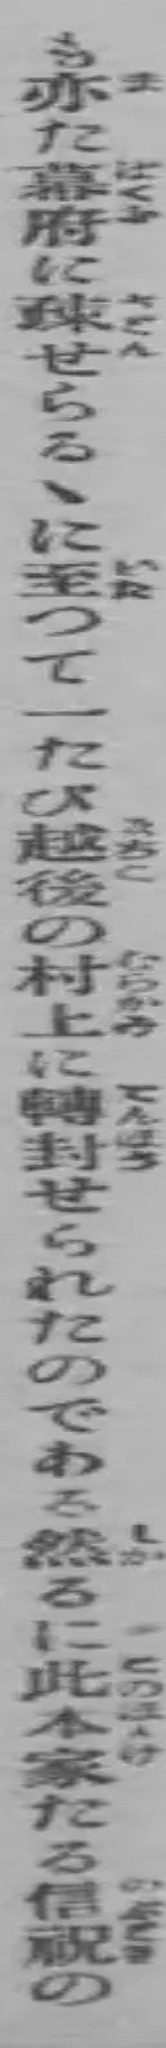も亦た幕府に疎せらるゝに至つて一たび越後の村上に転封せられたのである然るに此本家たる信祝の
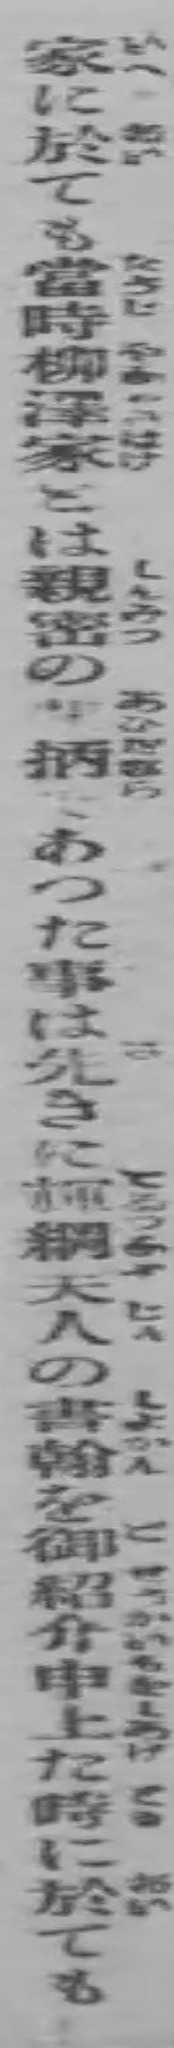家に於ても当時柳沢家とは親密の間柄であつた事は先きに輝綱夫人の書翰を御紹介申上た時に於ても
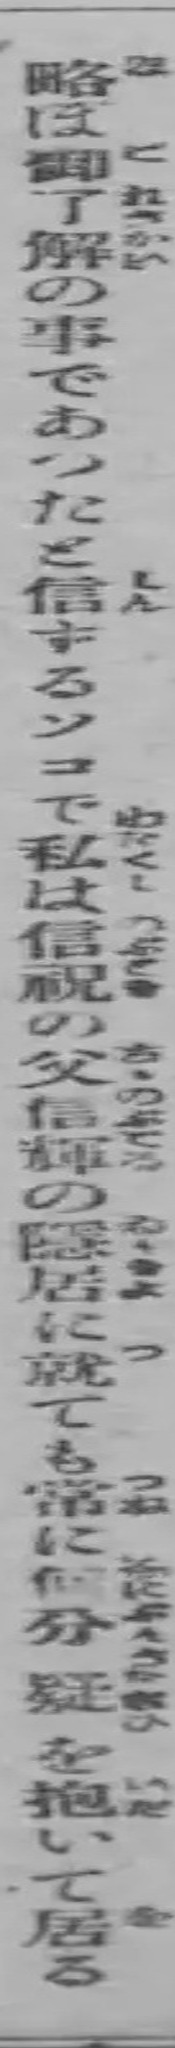略ぼ御了解の事であつたと信ずるソコで私は信祝の父信輝の隠居に就ても常に何分疑を抱いて居る
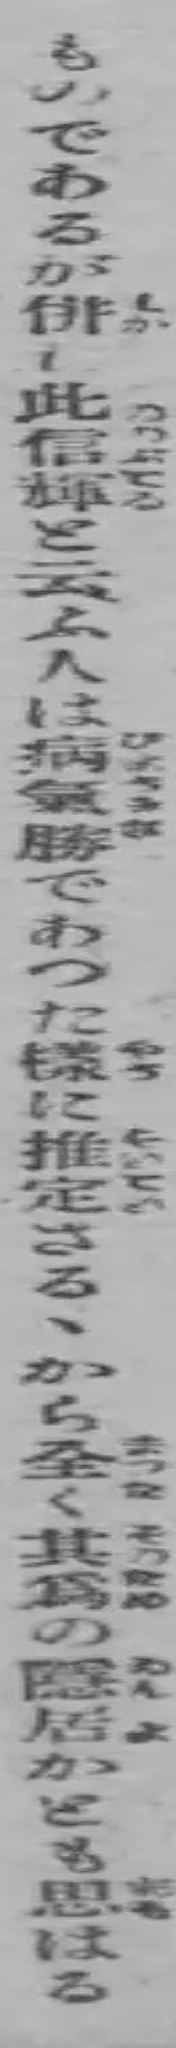ものであるが併し此信輝と云ふ人は病気勝であつた様に推定さるゝから全く其為の隠居かとも思はる
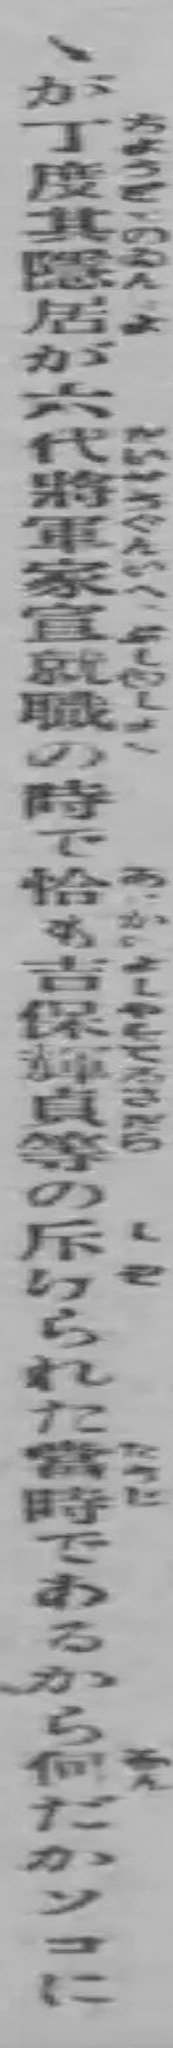ゝが丁度其隠居が六代将軍家宣就職の時で恰も吉保輝貞等の斥けられた当時であるから何だかソコに
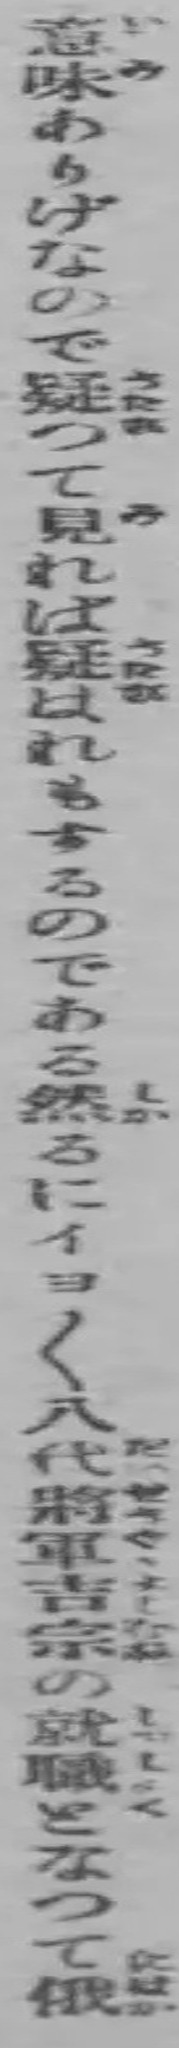意味ありげなので疑つて見れば疑はれもするのである然るにイヨ〳〵八代将軍吉宗の就職となつて俄
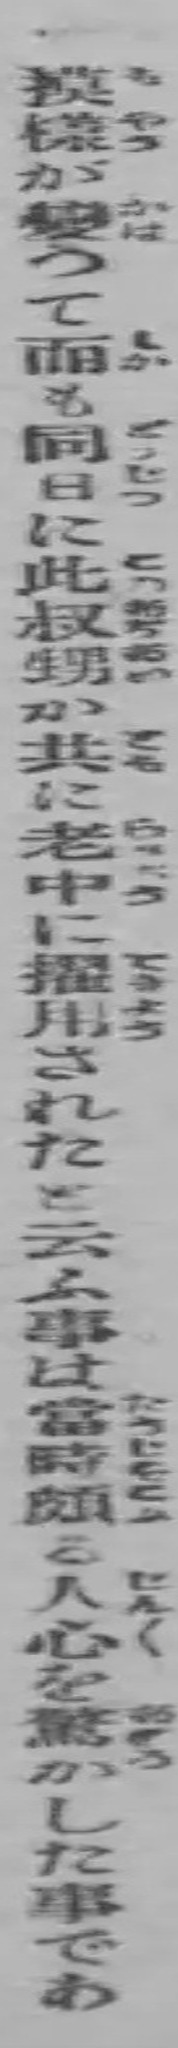に模様が変つて而も同日に此叔甥か共に老中に擁用されたと云ふ事は当時頗る人心を驚かした事であ
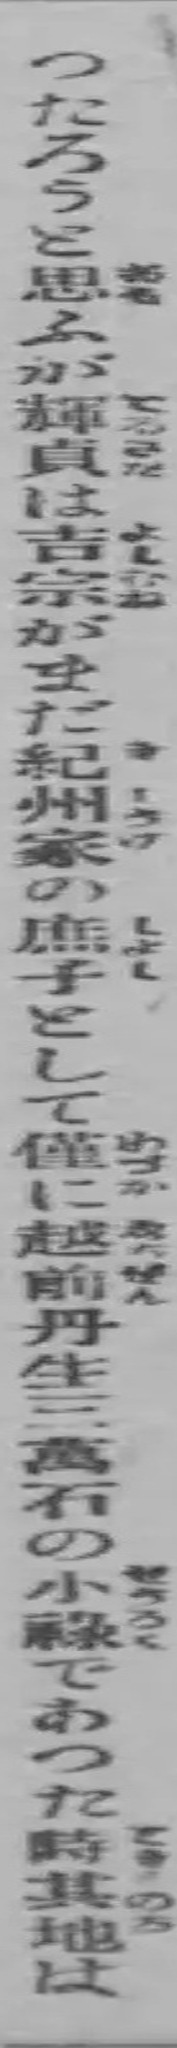つたろうと思ふが輝貞は吉宗がまだ紀州家の庶子として僅に越前丹生三万石の小禄であつた時其地は
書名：豊橋市史談
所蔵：国立国会図書館 National Diet Library, JAPAN
